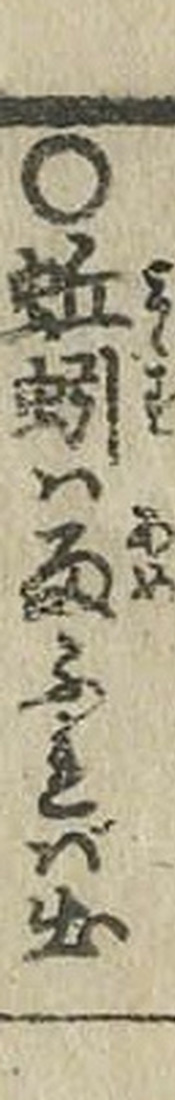○蚯蚓は雨ふれば出
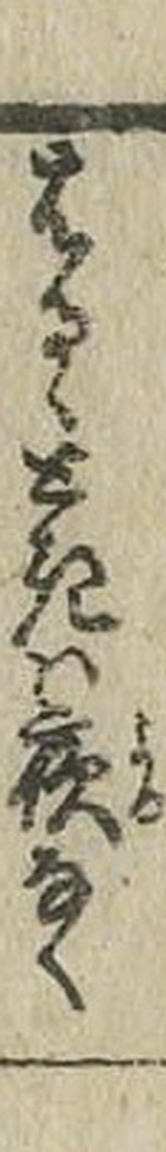はるゝときは夜なく

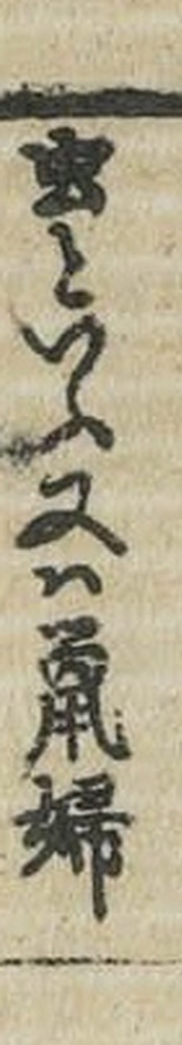虫といふ又は鼠婦
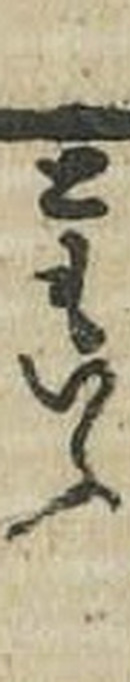ともいふ
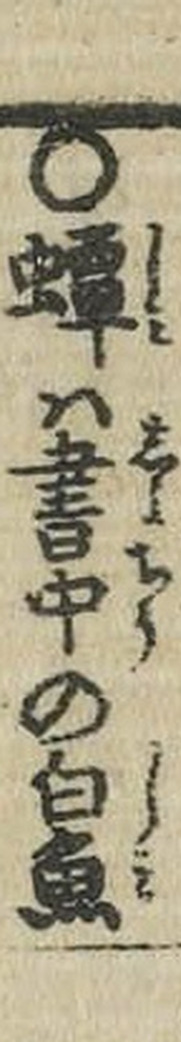○蟫は書中の白魚
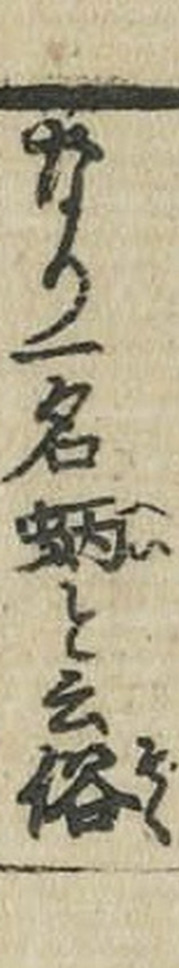なり一名蛃と云俗
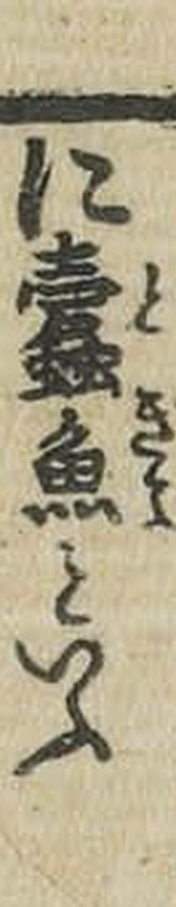に蠧魚といふ
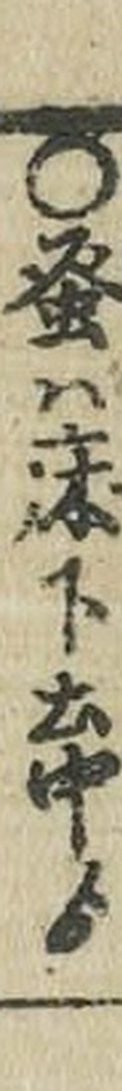○𤼭は床下土中ゟ
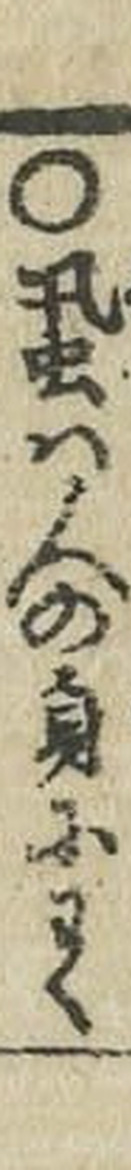○蝨は人の身にわく
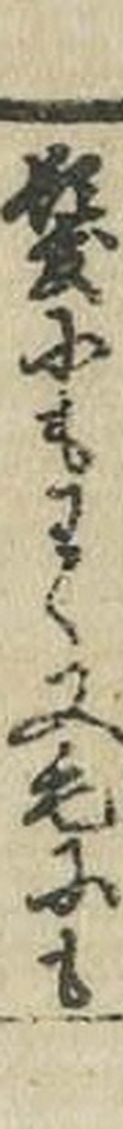髪にもわく又毛にも
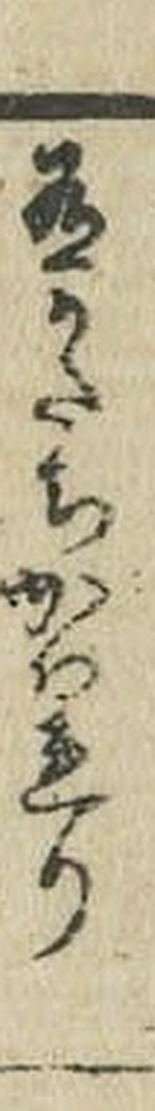有かたちかはれり
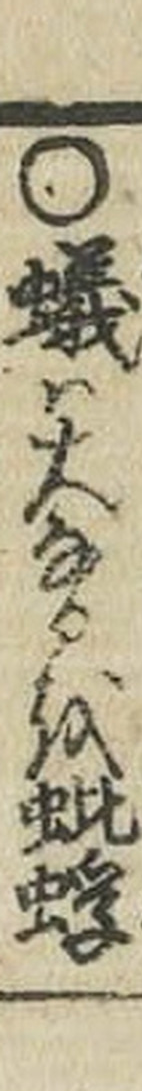○蟻は大なるを蚍蜉
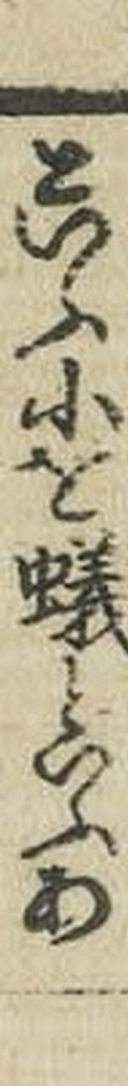といふ小を蟻といふあ
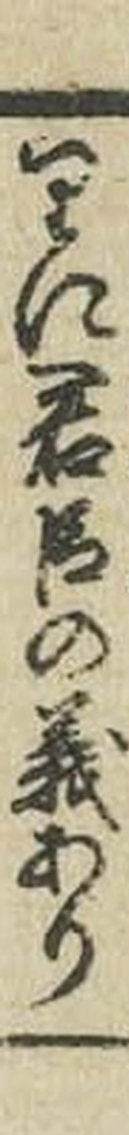りに君臣の義あり
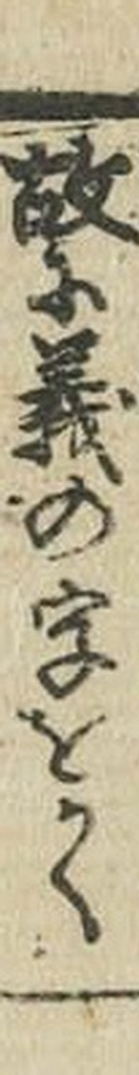故に義の字をかく
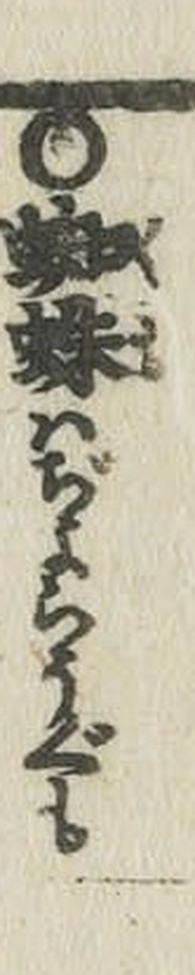○蜘蛛はぢようらうぐも
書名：増補頭書訓蒙図彙大成 10巻 7:巻之14-16
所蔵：東京学芸大学教育コンテンツアーカイブ
